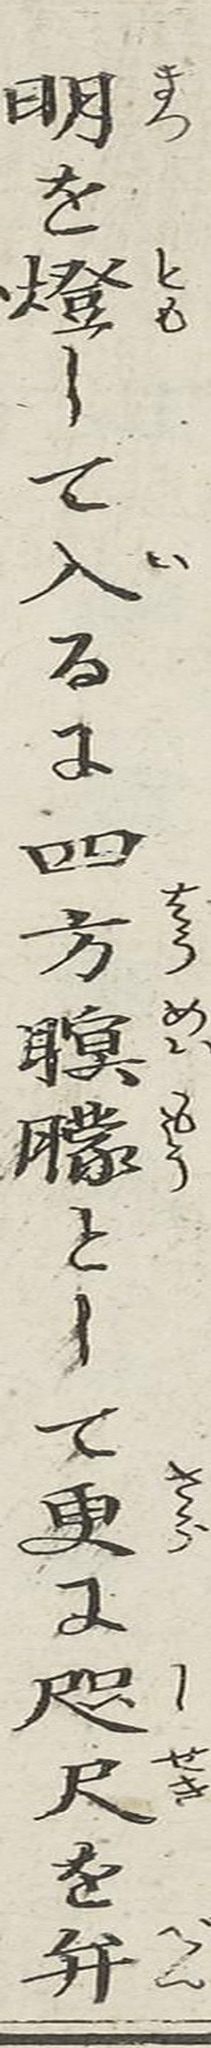明を燈して入るに四方瞑曚として更に咫尺を弁
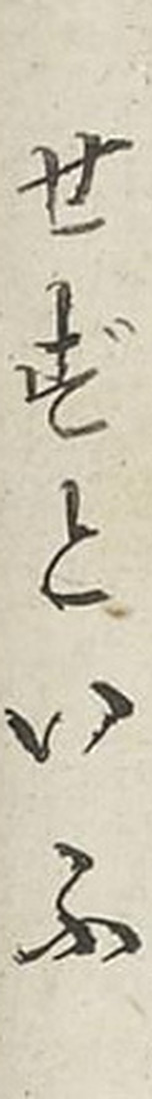せずといふ
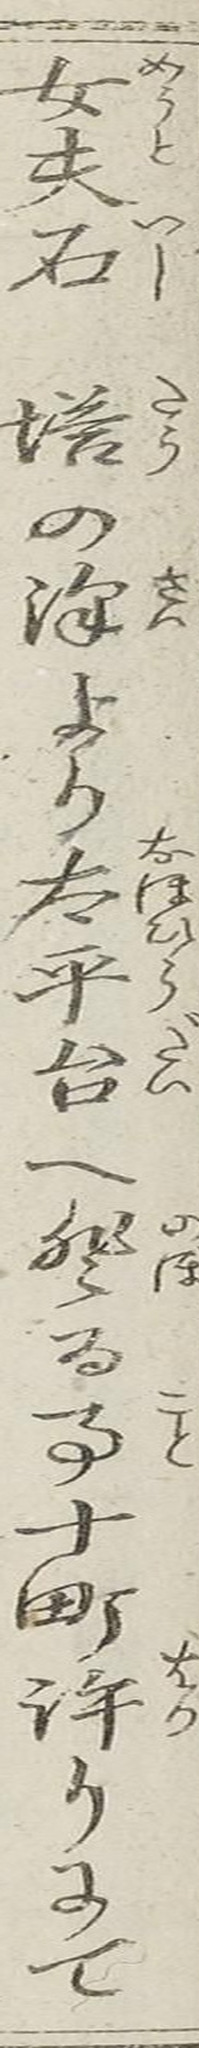女夫石塔の澤より太平台へ登る事十町許りにて
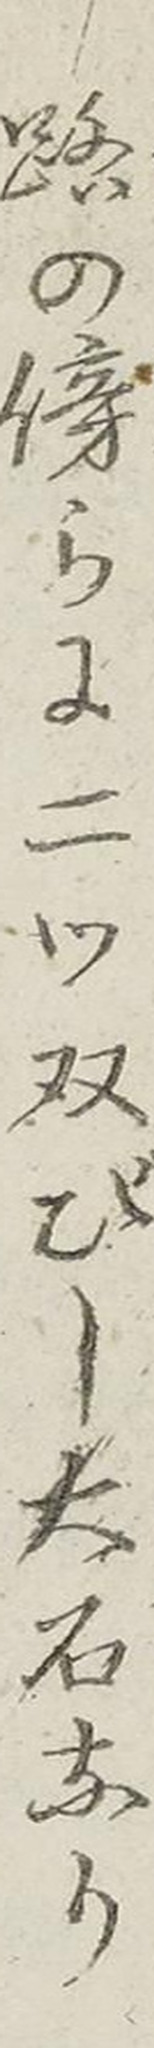路の傍らに二ッ双びし大石なり
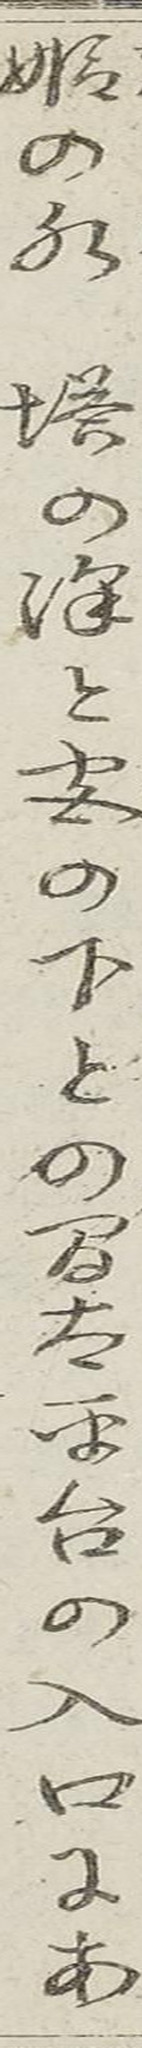姫の水塔の澤と宮の下との間太平台の入口にあ
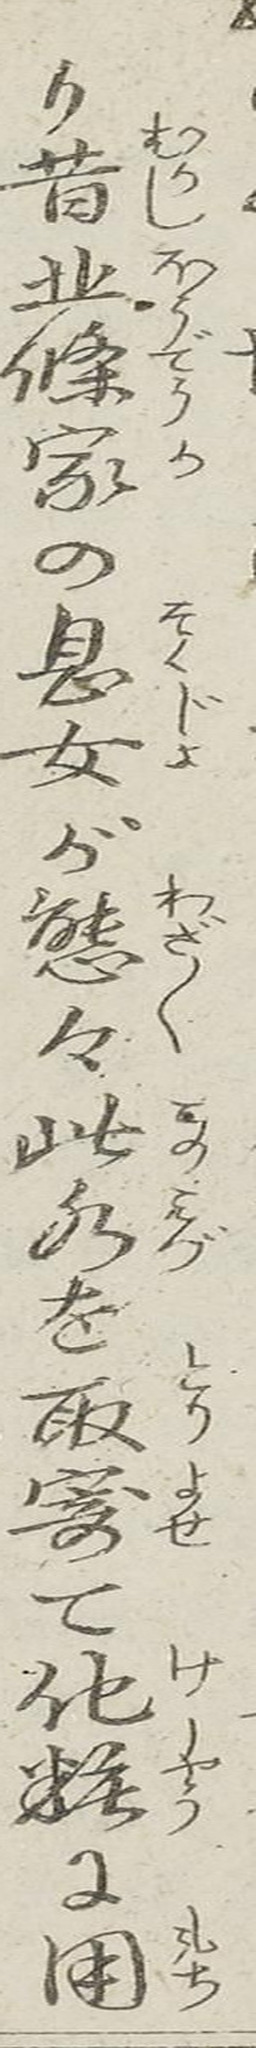り昔北條家の息女が態々此水を取寄て化粧に用
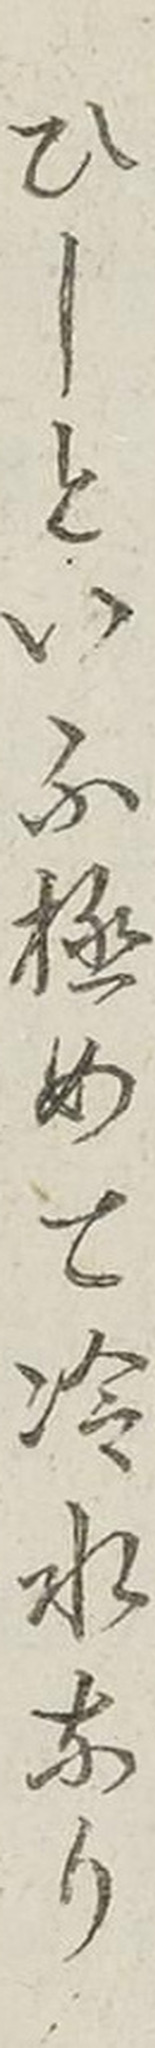ひしといふ極めて冷水なり
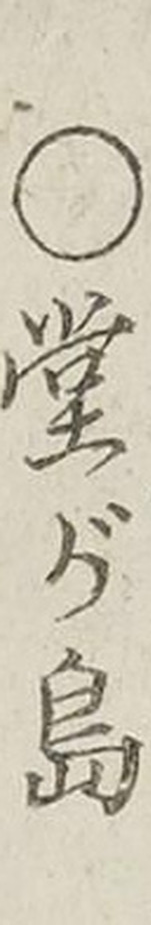○堂が島
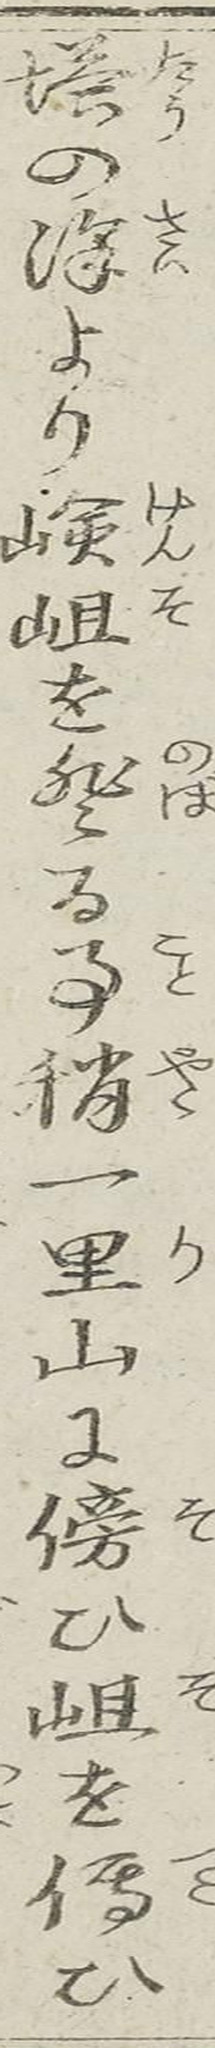塔の澤より嶮岨を登る事稍一里山に傍ひ岨を伝ひ
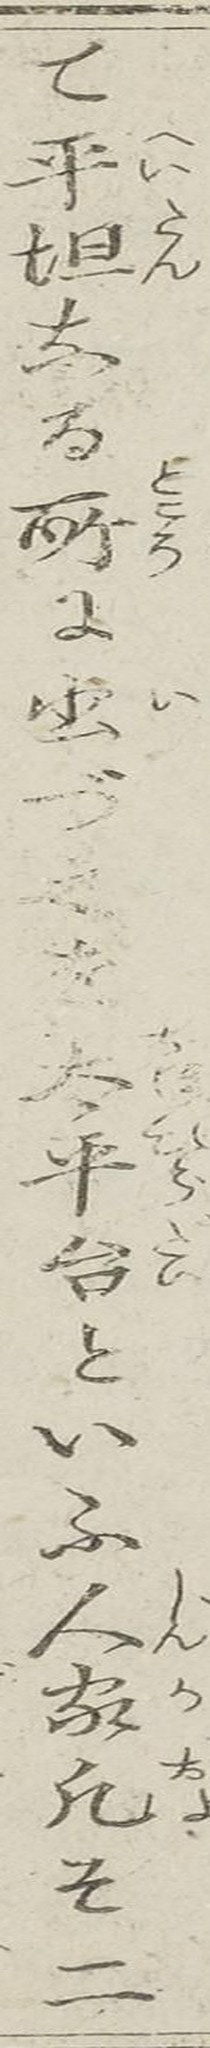て平坦なる所に出づくを太平台といふ人家凡そ二
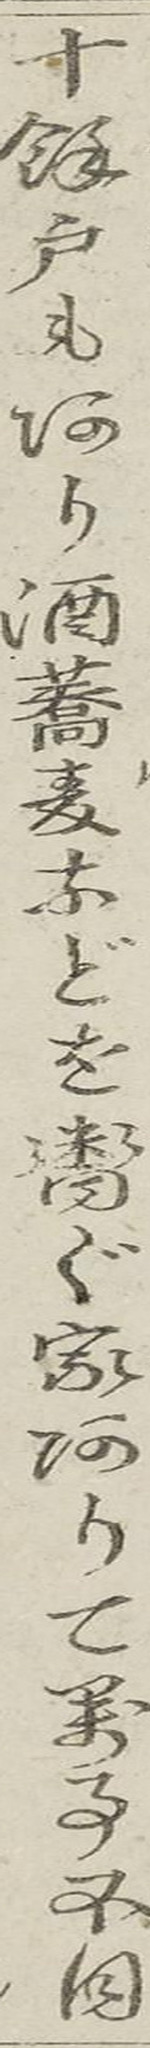十餘戸もあり酒蕎麦などを鬻ぐ家ありて萬事不自
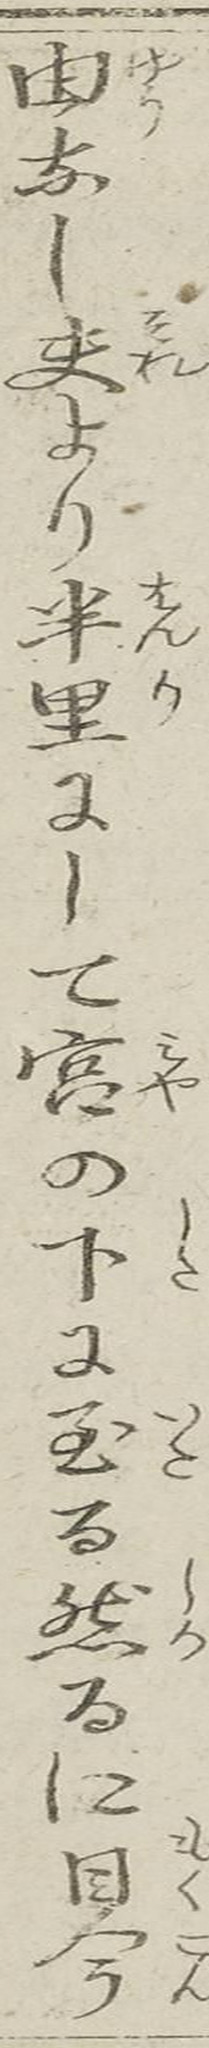由なし夫より半里にして宮の下に至る然るに目今

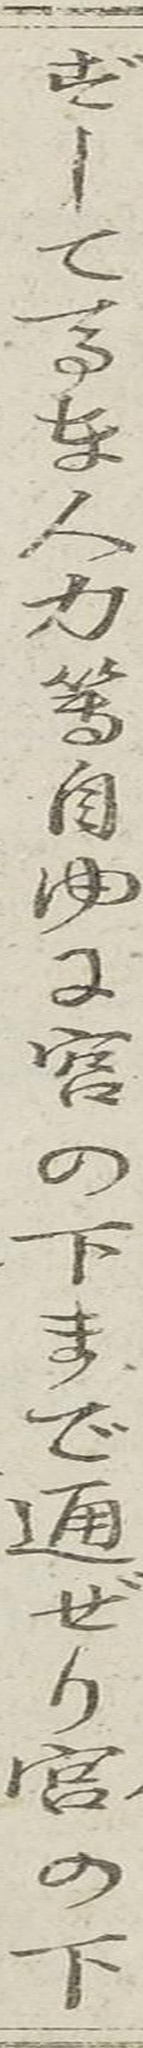ずして馬車人力等自由に宮の下まで通ぜり宮の下
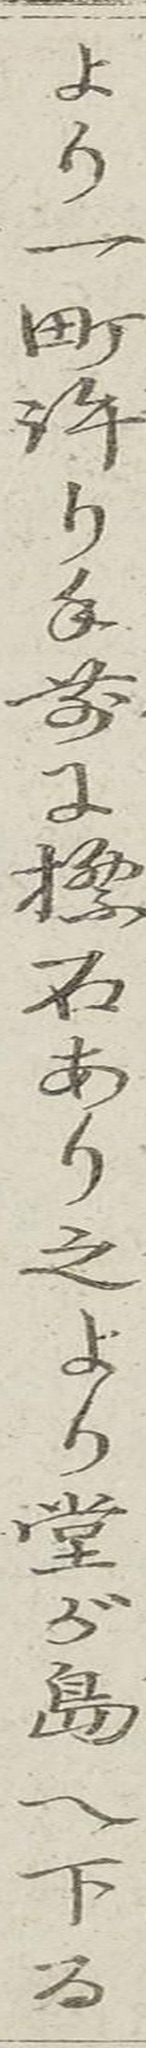より一町許り手前に標石あり之より堂が島へ下る
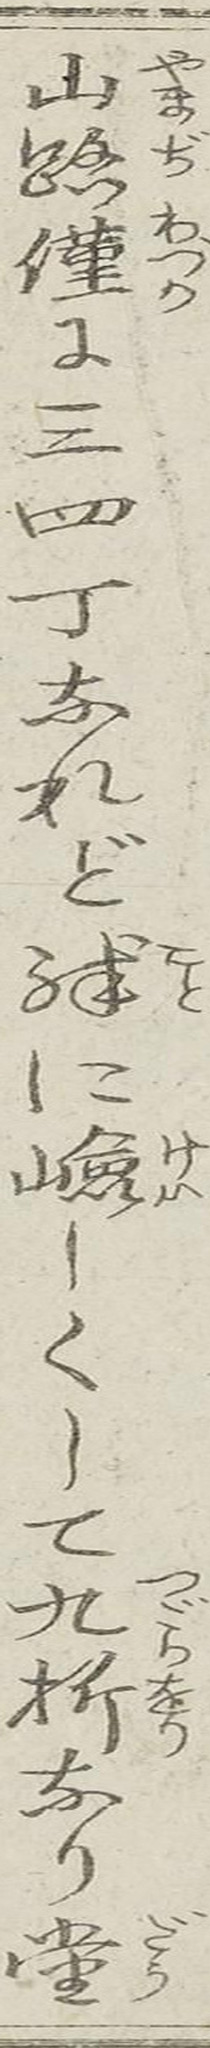山路僅に三四丁なれど殊に嶮しくして九折なり堂
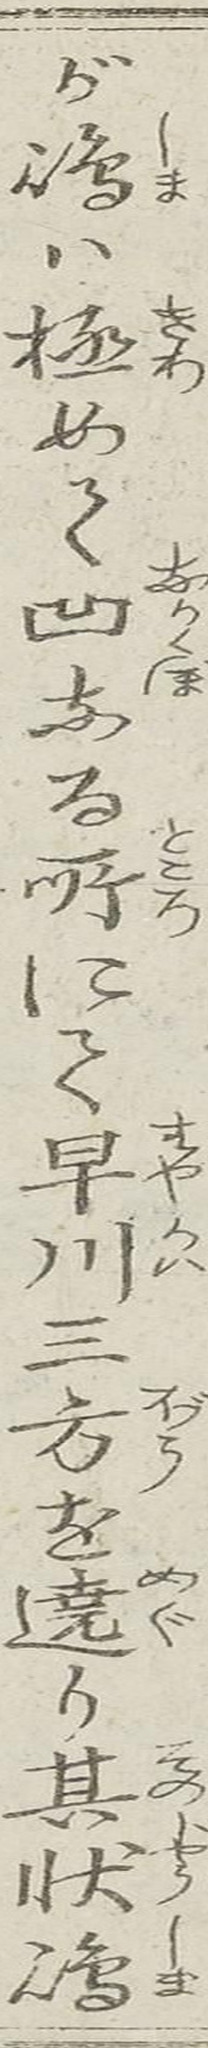が嶋は極めて凹なる所にて早川三方を遶り其状嶋
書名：箱根温泉誌　全
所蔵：東京大学地震研究所図書室 Earthquake Research Institute Library, The University of Tokyo, JAPAN
